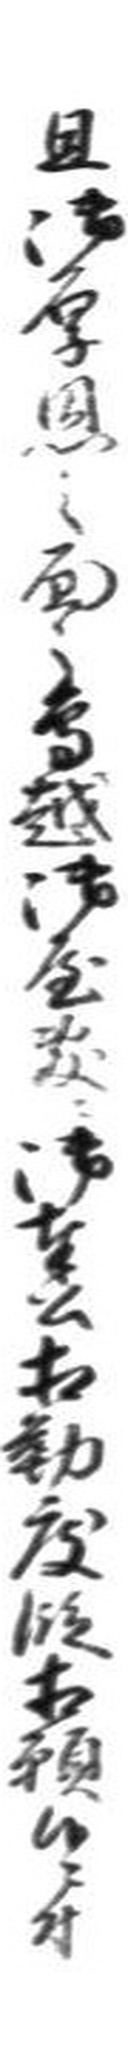且御厚恩之面々鳥越御屋敷ニ御奉公相勤度段相願候ニ付
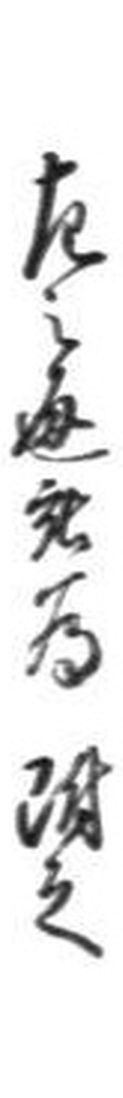左之通被為附之
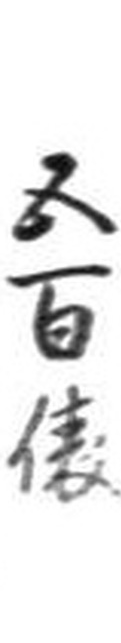五百俵
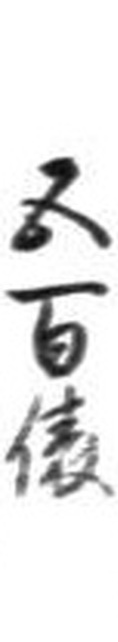五百俵
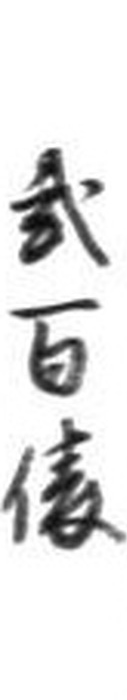弐百俵
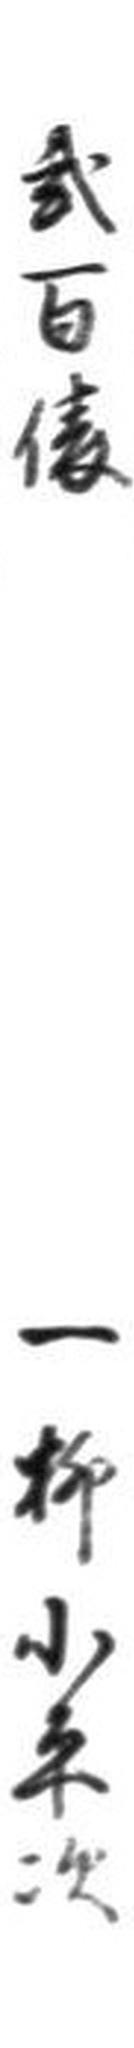元四百石一柳小平次
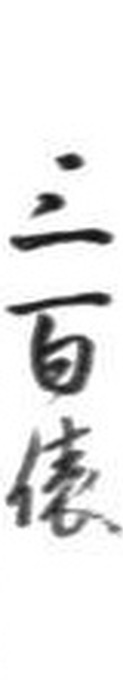三百俵
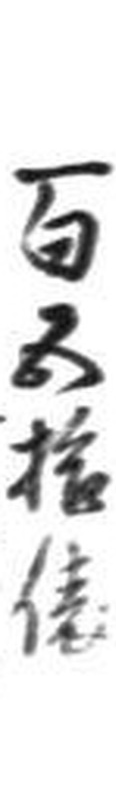百五拾俵

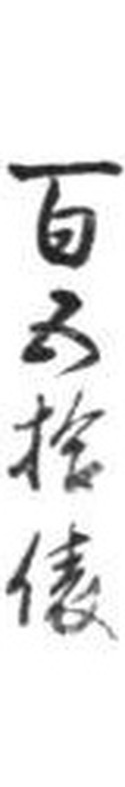百五拾俵
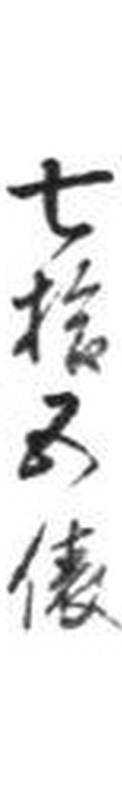七拾五俵
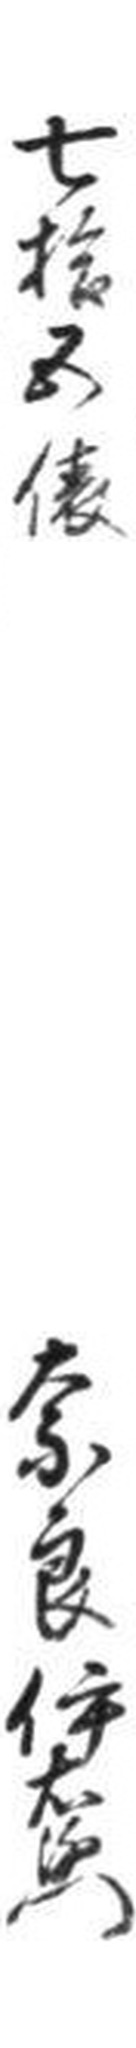元百五拾石奈良伊右衛門
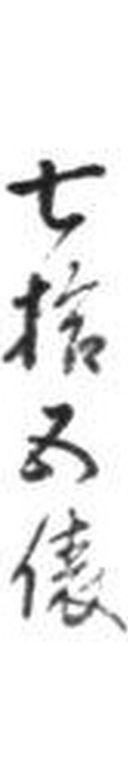七拾五俵
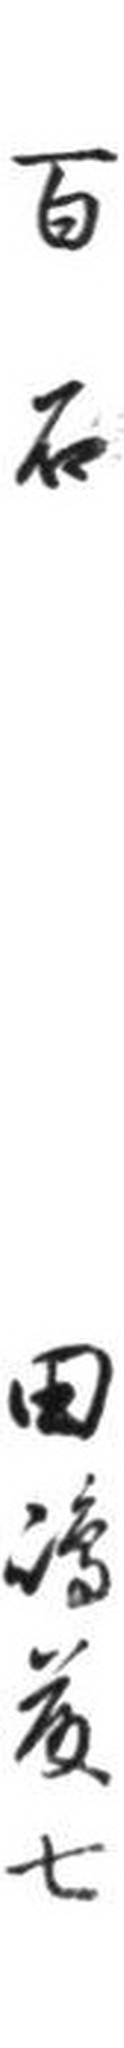百石田嶋藤七
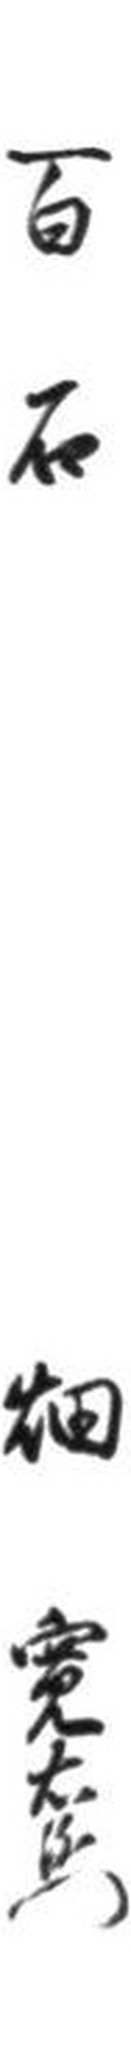百石畑寛右衛門
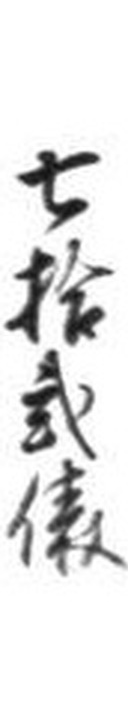七拾弐俵
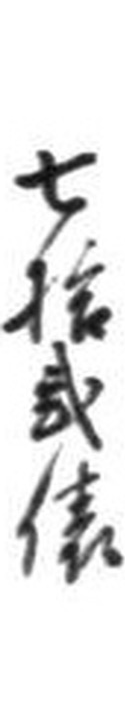七拾弐俵
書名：家譜 十五 綱昌公 従天和元年到元禄十二年
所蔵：福井県文書館 Fukui Prefectural Archives
